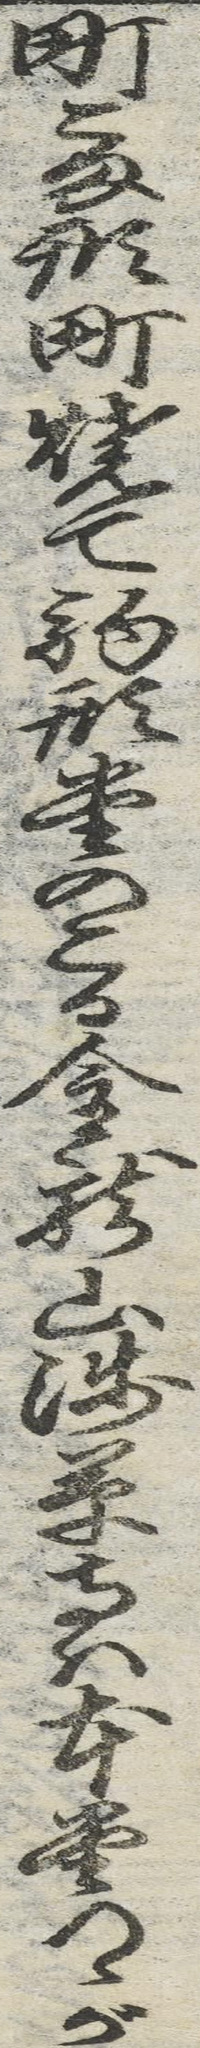町こま形町焼て釣形堂のこる金龍山浅草寺は本堂つゝが
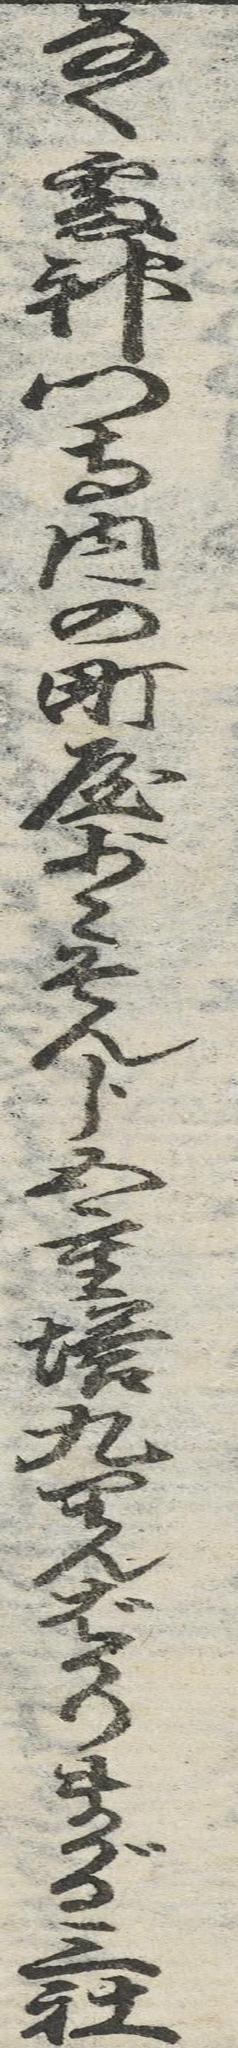なく雷神門寺内の町屋少々そんじ五重塔九りんばかりまがる三社
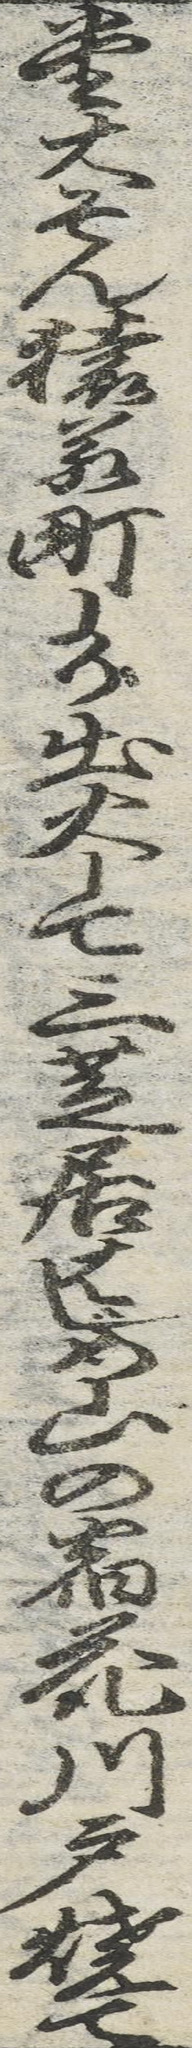堂大そん猿若町より出荷して三芝居はじめ山の宿花川戸焼て
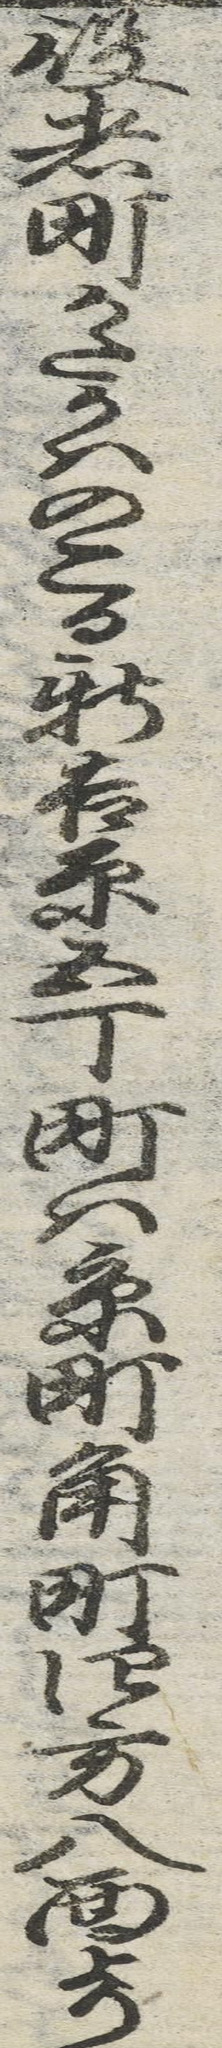役者町かたかはのこる新吉原五丁町は京町角町四方八面より
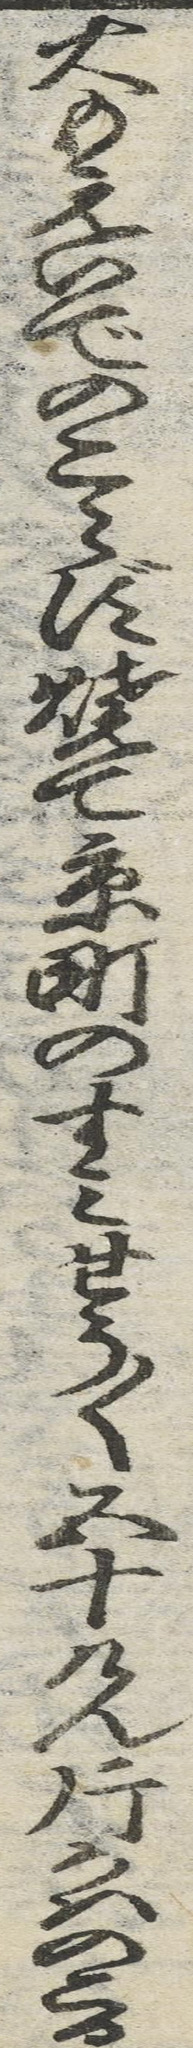大もえいでのこらず焼て京町のすみせう〳〵五十けん片かはのこる
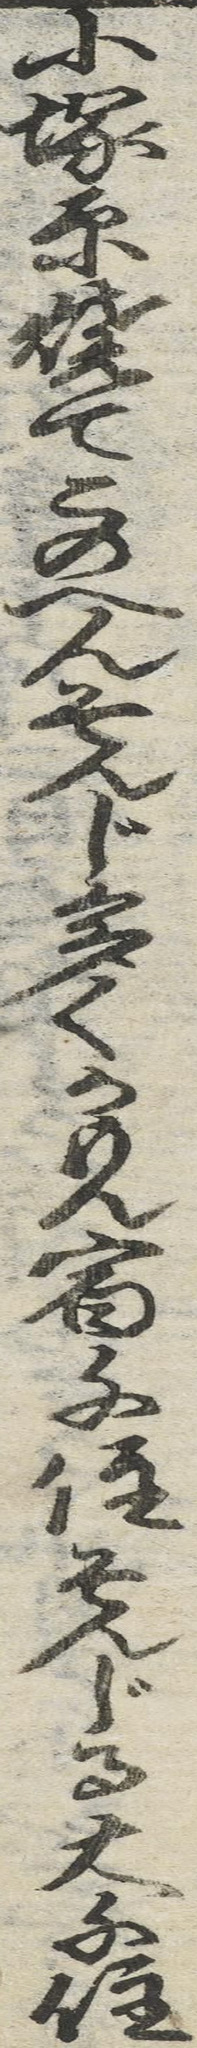小塚原焼てこのへんそんじ多くかもん宿千住そんじる大千住
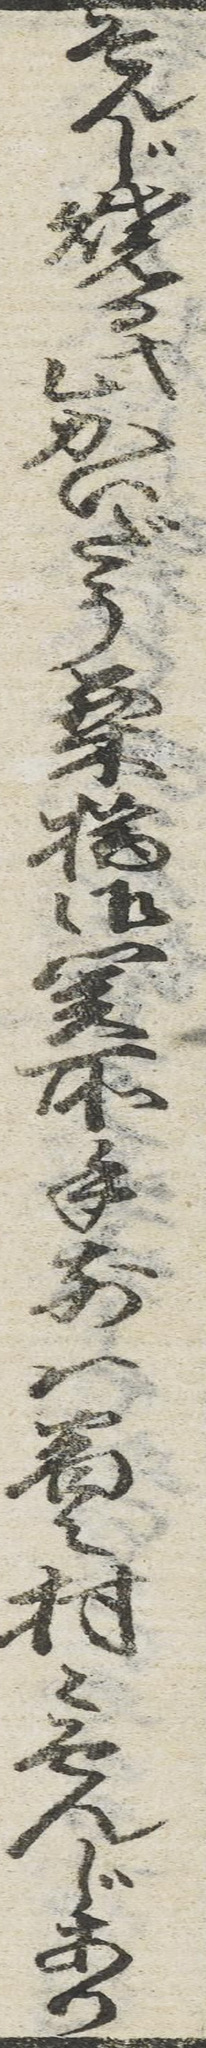そんじ焼る此かいだう栗橋御関所手前は宿々村々そんじあり
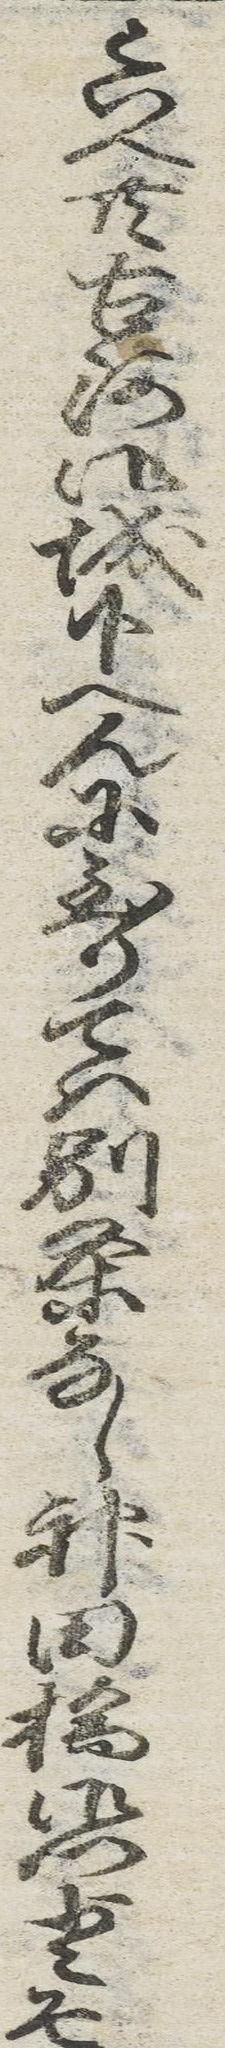といへ共古河御城下へんに至りては別条なし神田橋御門少々そ
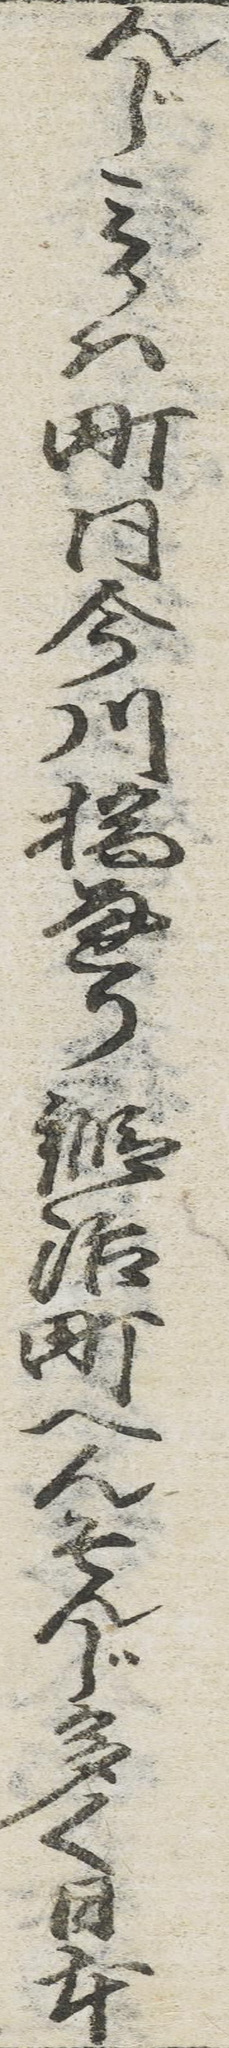んじみかは町内今川橋通り鍛冶町へんそんじ多く日本
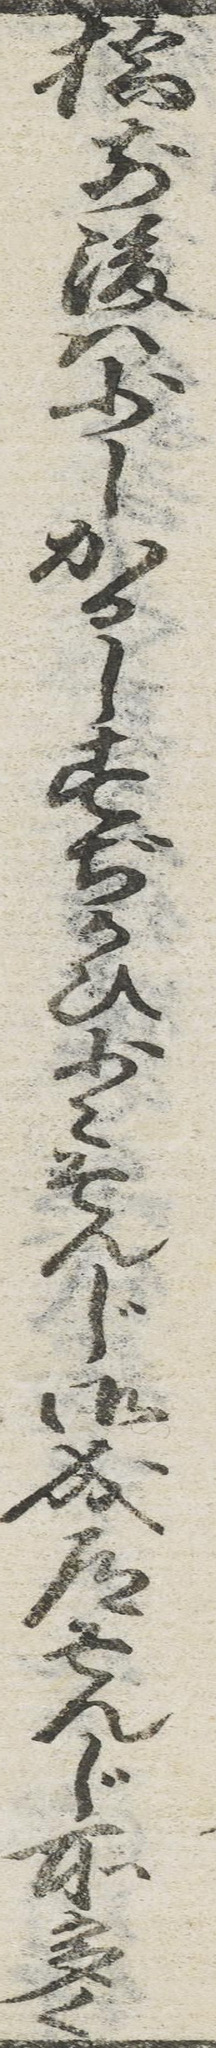橋前後は少しかるしすぢかひ少々そんじ御成道そんじ所多く
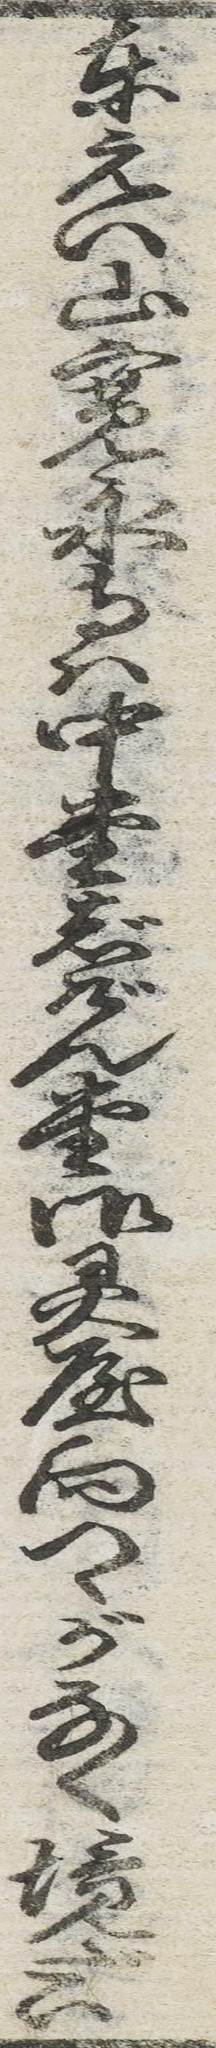東えい山寛永寺は中堂じげん堂御霊屋向つゝがなく境だい
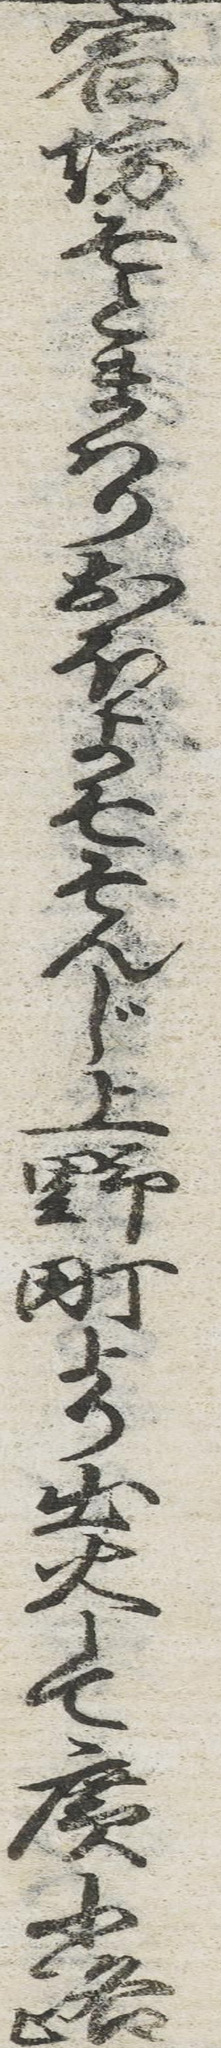宿坊そとまはりおほよそそんじ上野町より出火して広小路
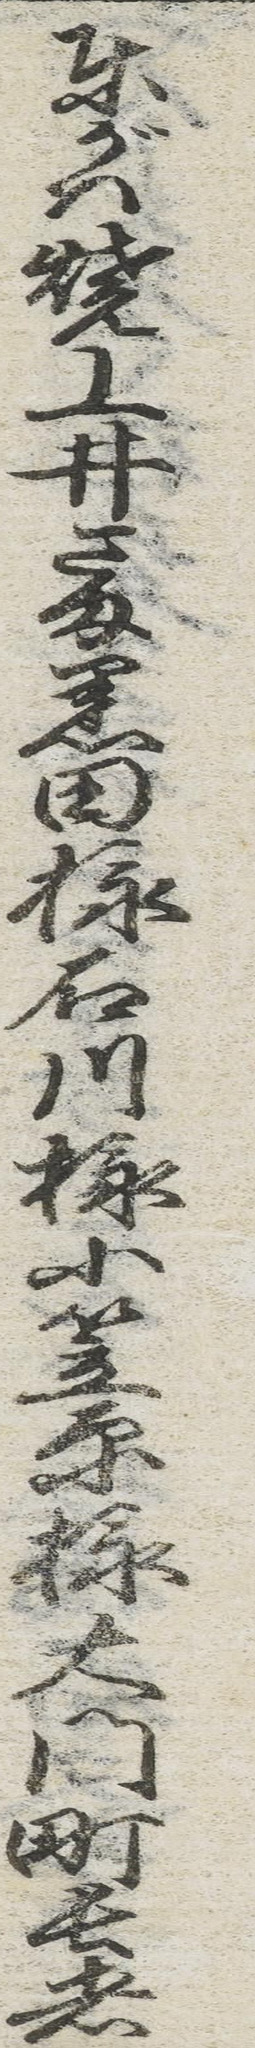東がは焼土井さま黒田様石川様小笠原様大門町長者
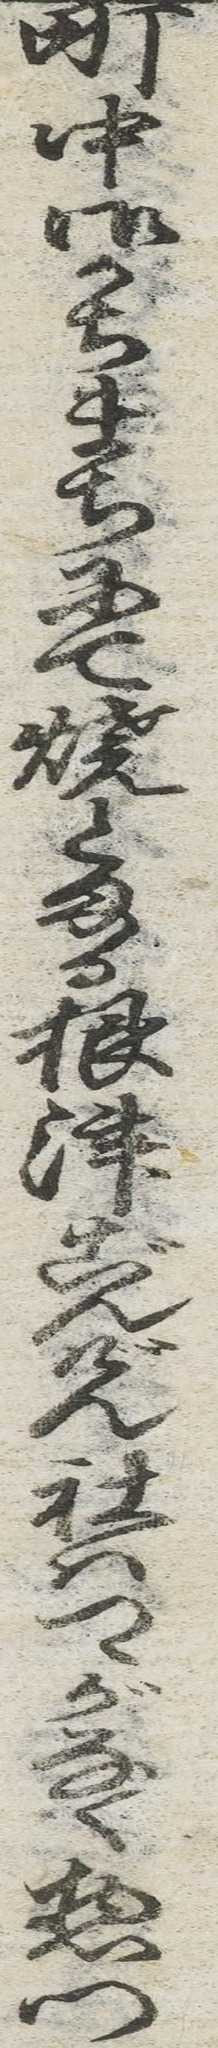町中御かちまちにて焼とまる根津ごんげん社はつゝがなく惣門
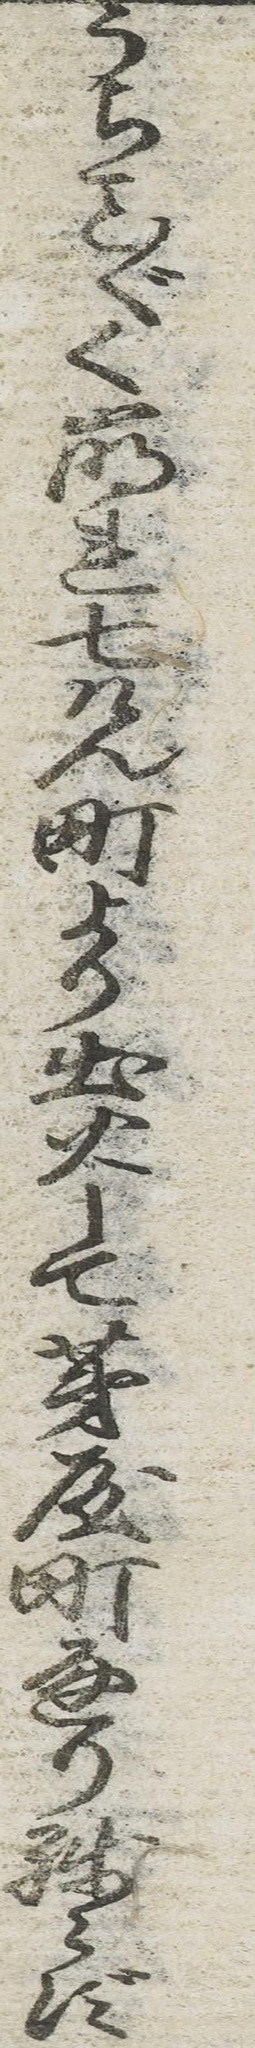うちこと〴〵く崩れ七けん町より出火して茅屋町通り残らず
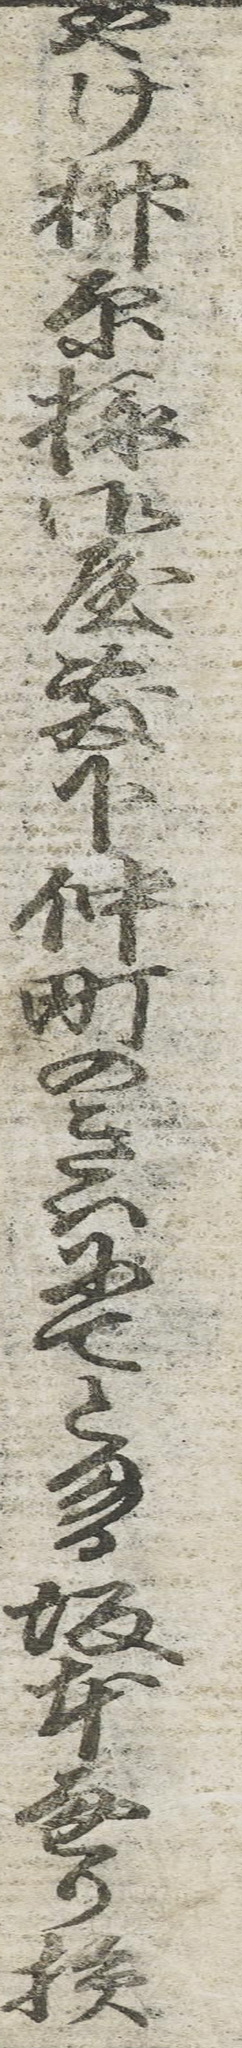やけ榊原様御屋敷下仲町のきはにてとまる坂本通り損
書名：関東　大地震細記
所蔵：東京大学地震研究所図書室 Earthquake Research Institute Library, The University of Tokyo, JAPAN
